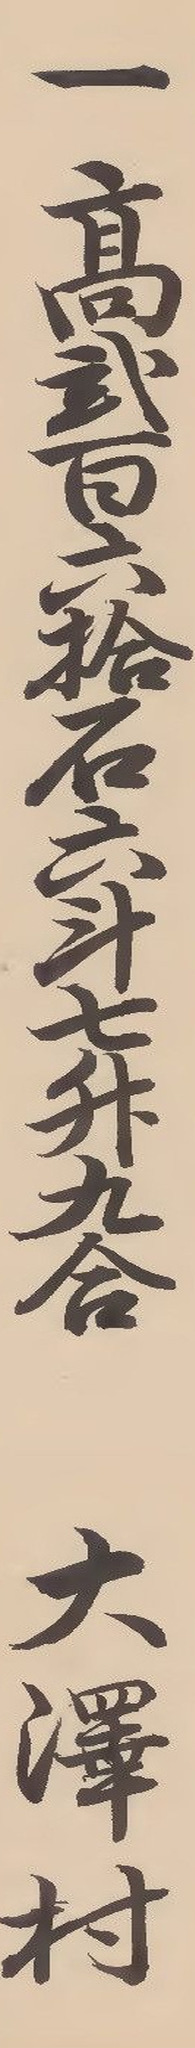一高弐百六拾石六斗七升九合大沢村
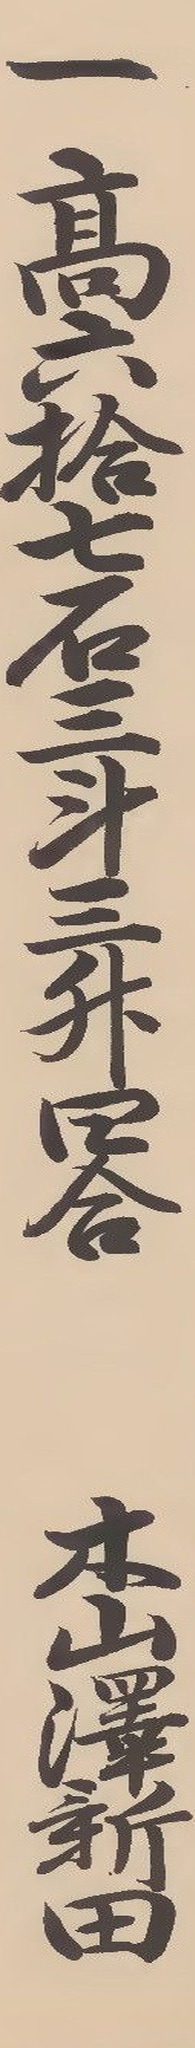一高六拾七石三斗三升四合木山沢新田
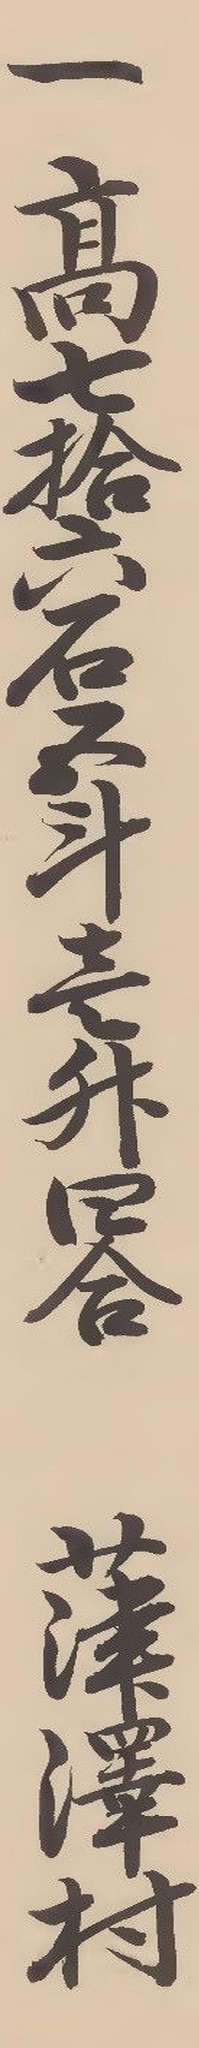一高七拾六石五斗壱升四合葏沢村
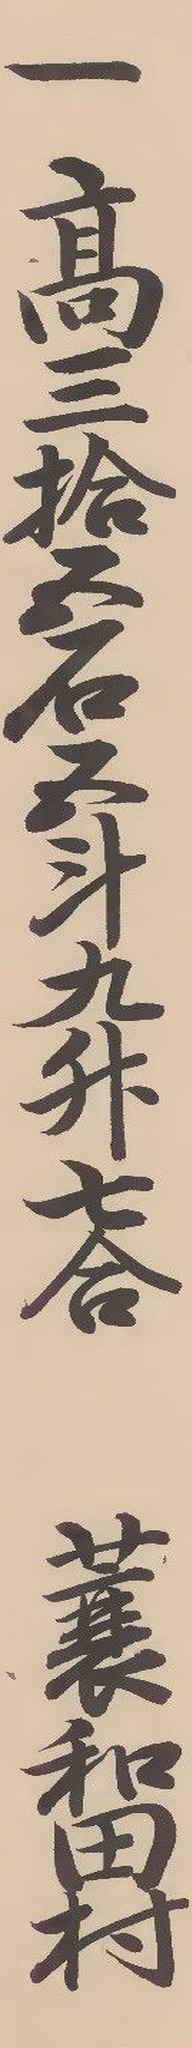一高三拾五石五斗九升七合蓑和田村
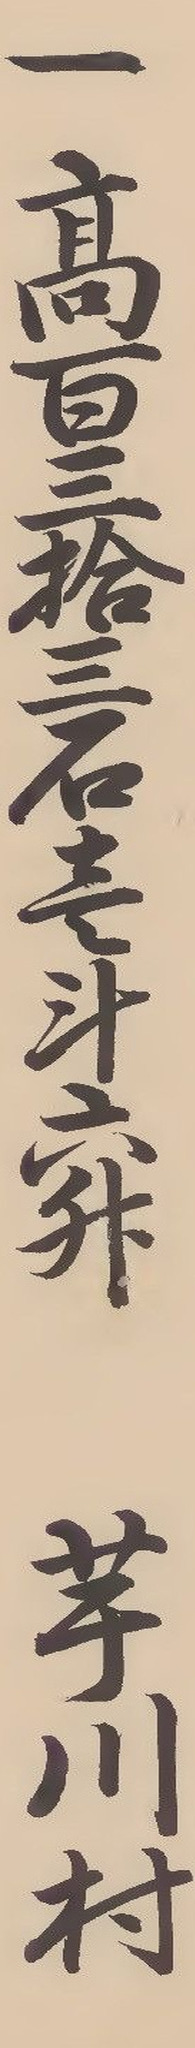一高百三拾三石壱斗六升芋川村

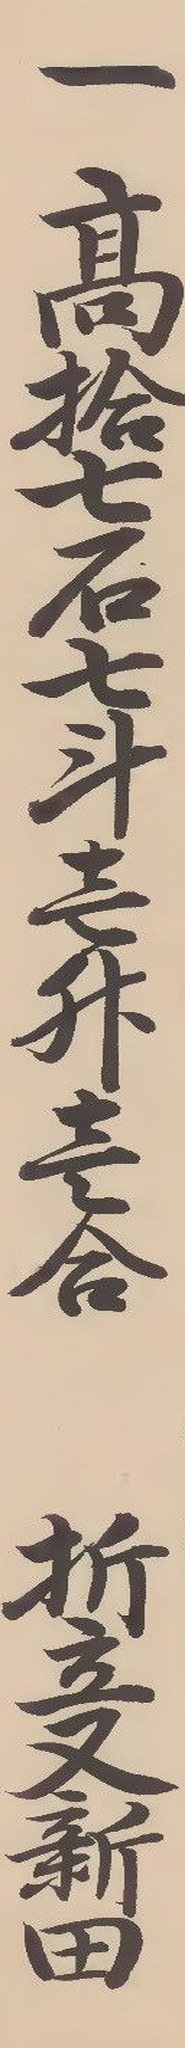一高拾七石七斗壱升壱合折立又新田
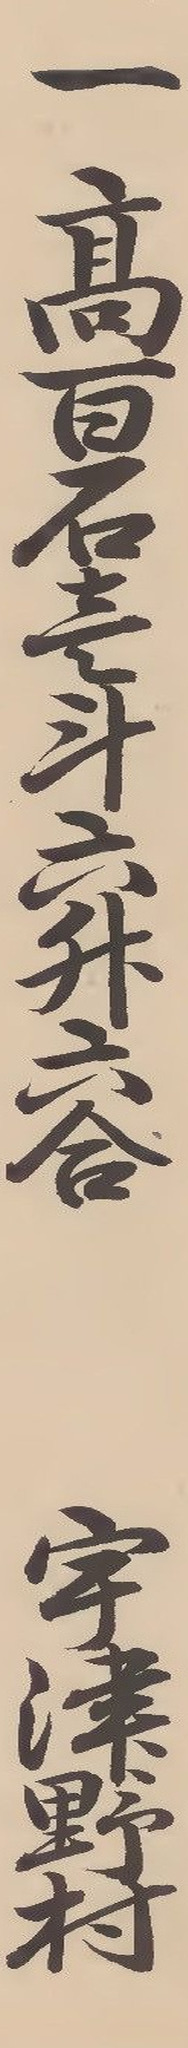一高百石壱斗六升六合宇津野村
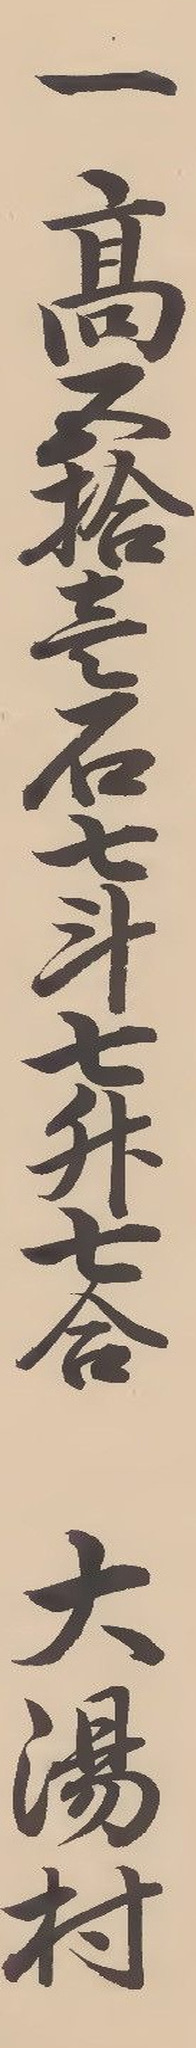一高五拾壱石七斗七升七合大湯村
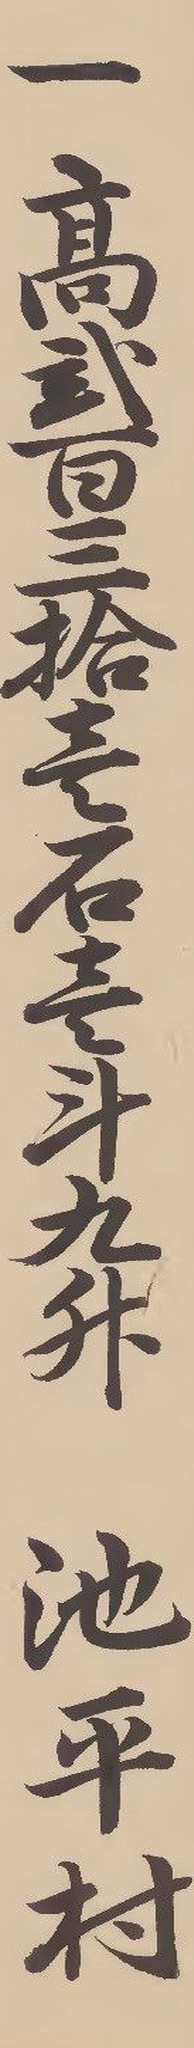一高弐百三拾壱石壱斗九升池平村
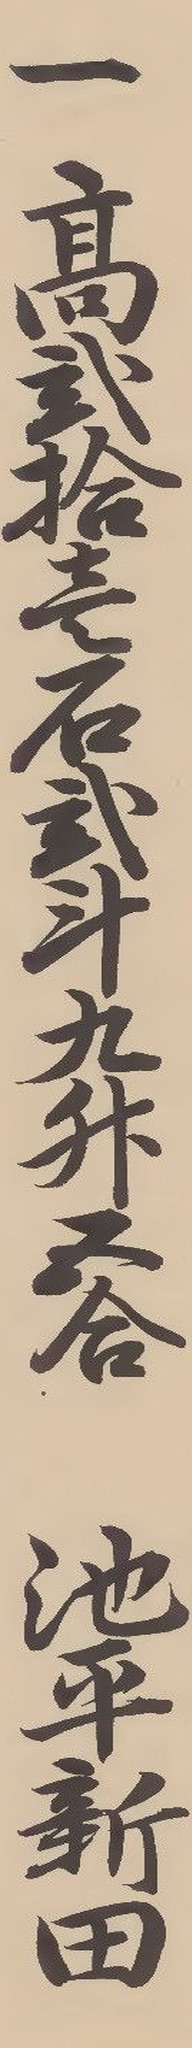一高弐拾壱石弐斗九升五合池平新田
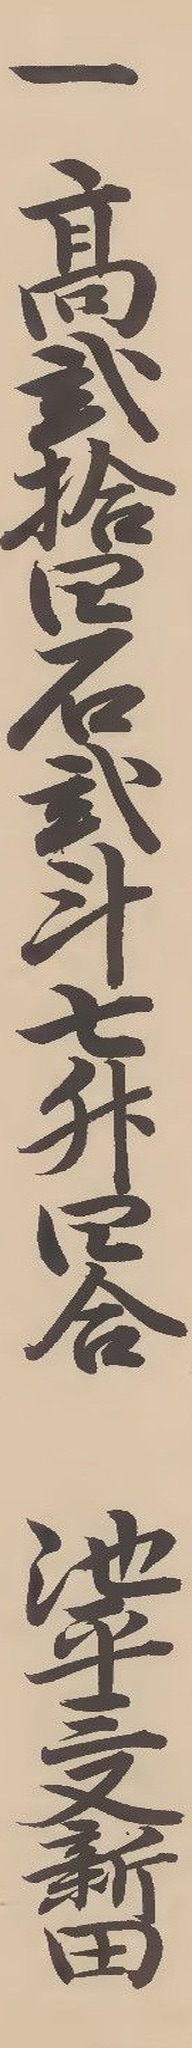一高弐拾四石弐斗七升四合池平三又新田
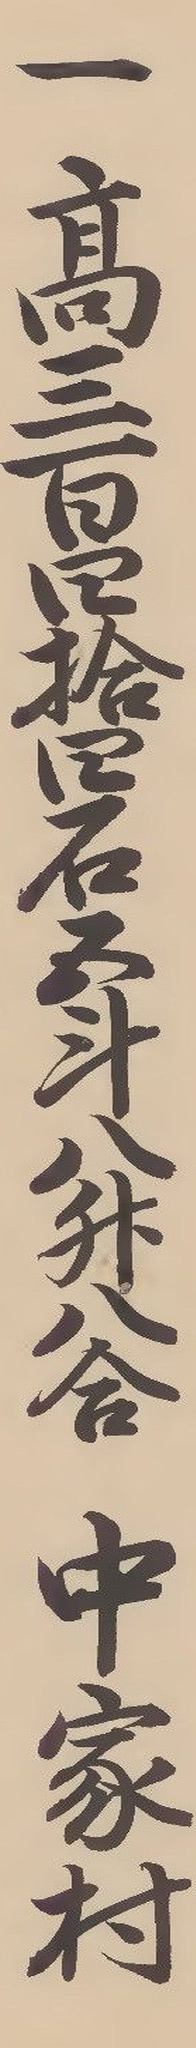一高三百四拾四石五斗八升八合中家村

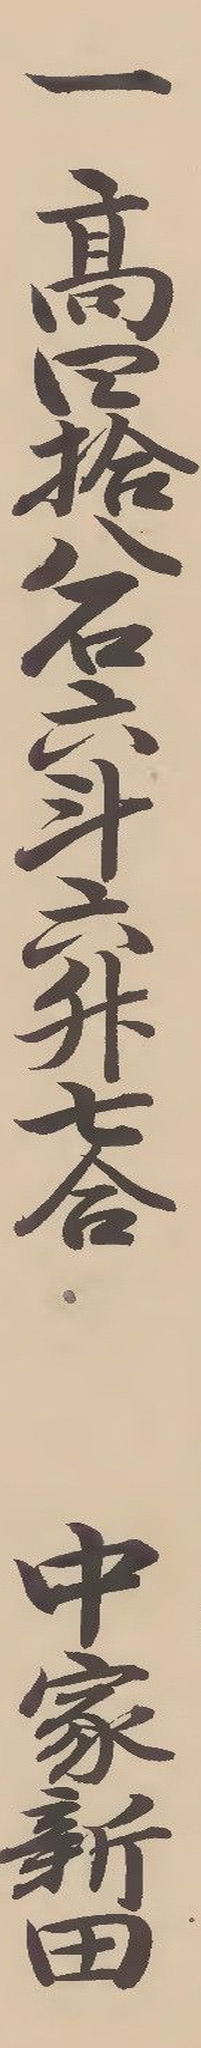一高四拾八石六斗六升七合中家新田
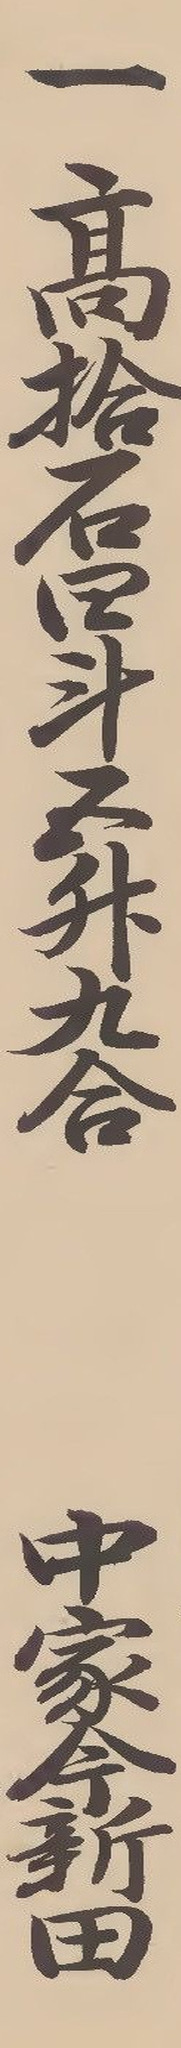一高拾石四斗五升九合中家今新田
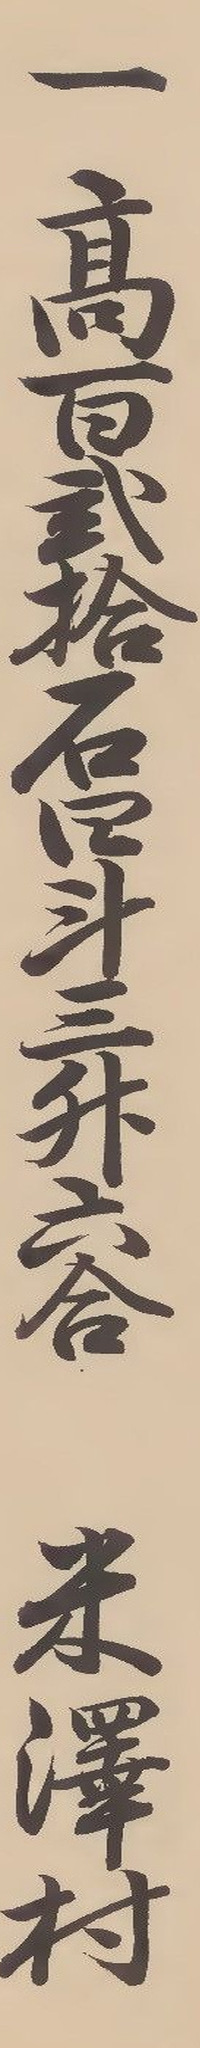一高百弐拾石四斗三升六合米沢村
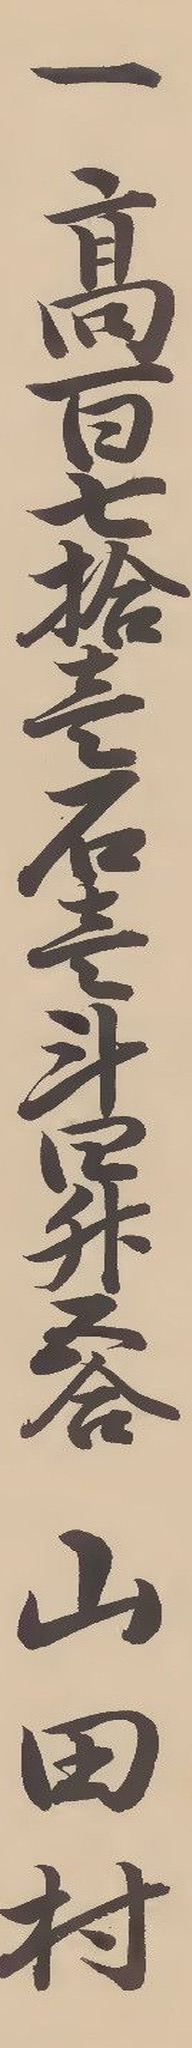一高百七拾壱石壱斗四升五合山田村
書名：越後国郷帳　中
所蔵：国立公文書館 National Archives of Japan
